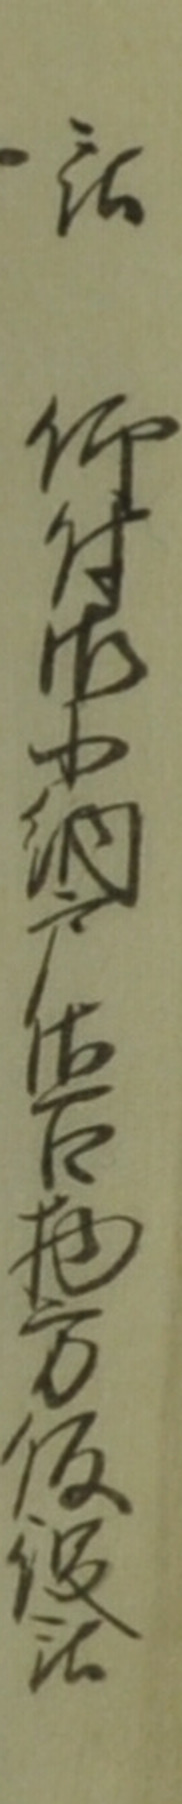被仰付御小納戸御召物方仮役被
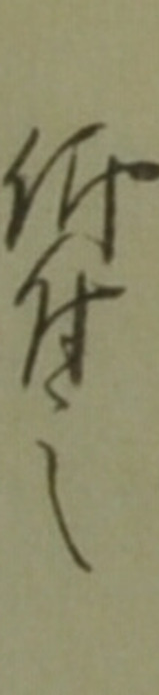仰付之
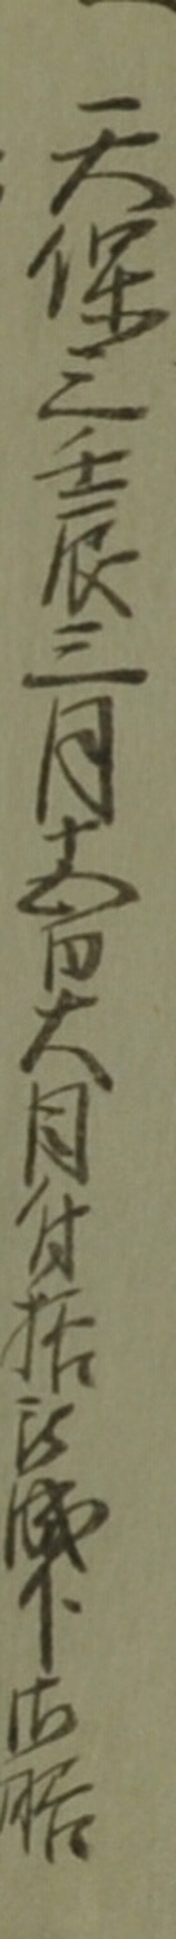一天保三壬辰三月十五日大目付格被成下御膳
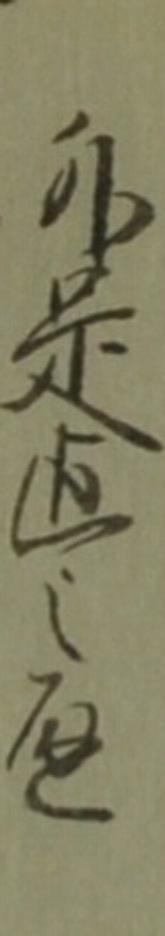外是迄之通
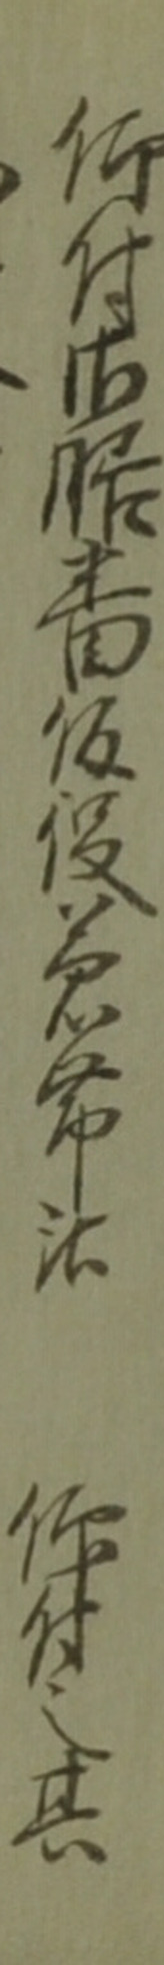仰付御膳番仮役兼帯被仰付之其
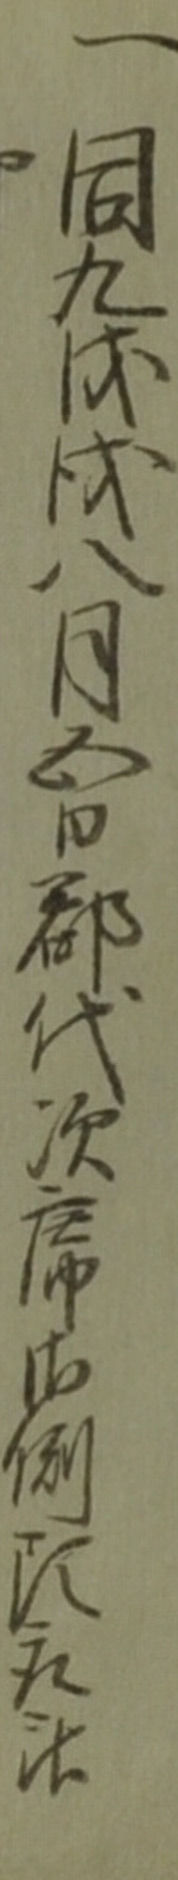一同九戊戌八月五日郡代次席御側頭取被
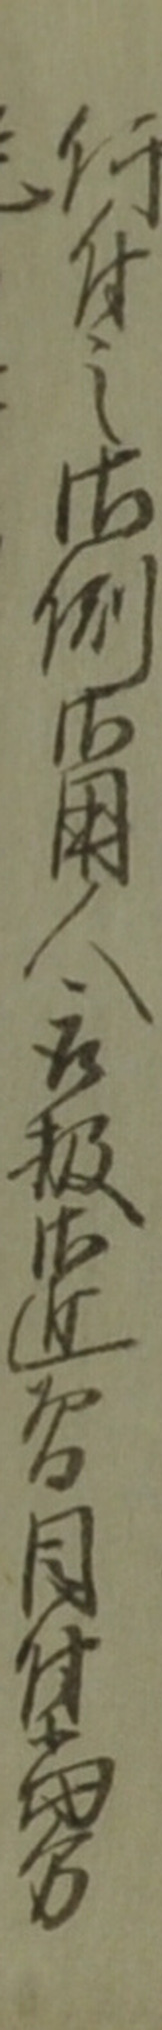仰付之御側御用人取扱御近習目付当分
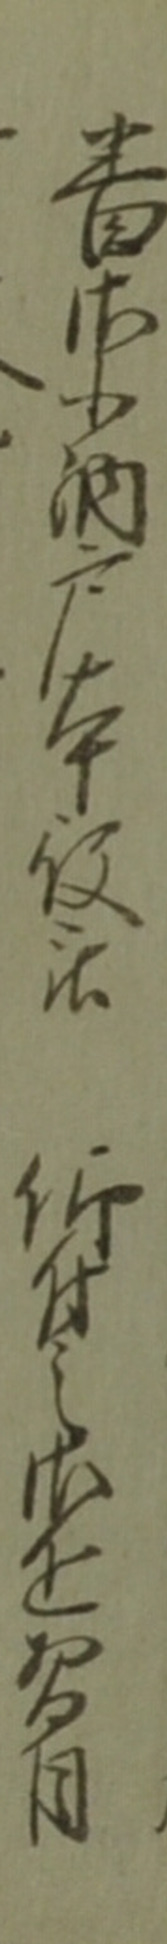番御小納戸本役被仰付之御近習目
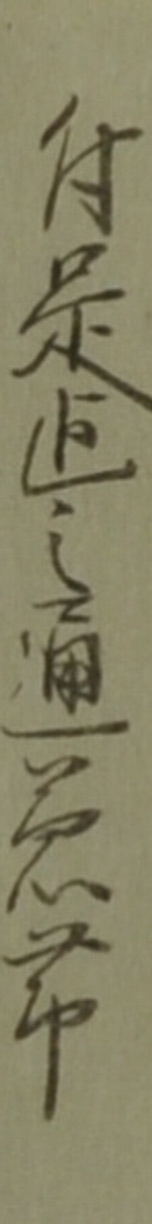付是迄之通兼帯
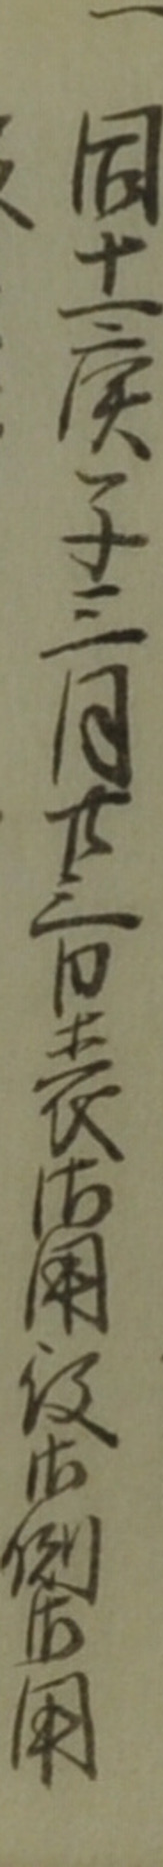一同十一庚子三月廿三日表御用役御側御用
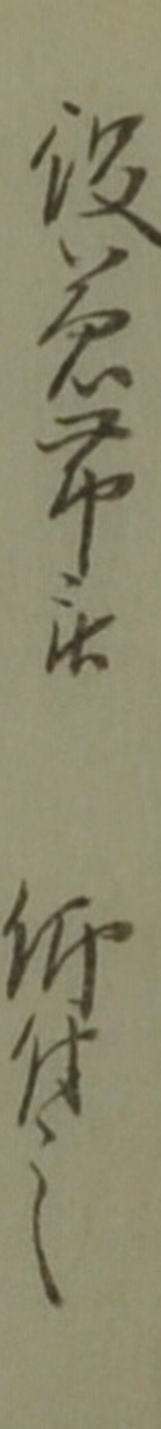役兼帯被仰付之
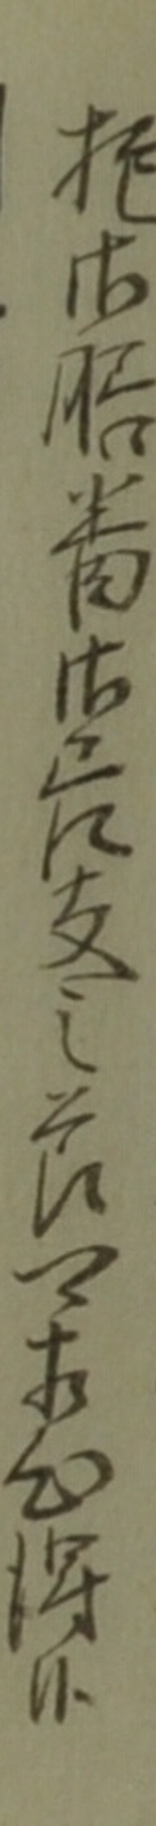抱御膳番御差支之節可相心得候
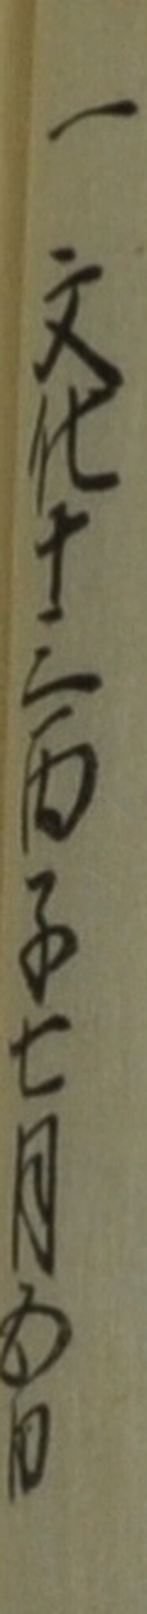一文化十三丙子七月五日
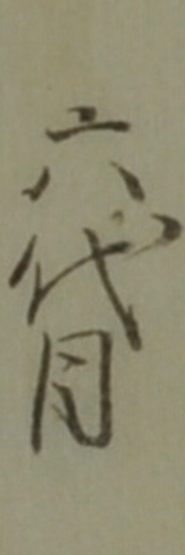六代目
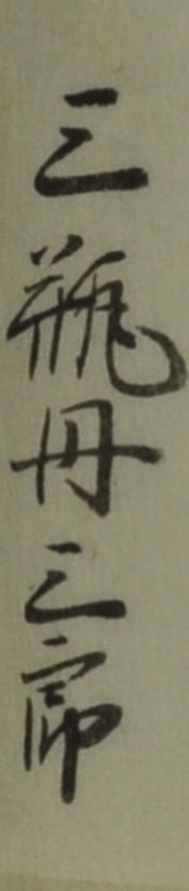三瓶丹三郎
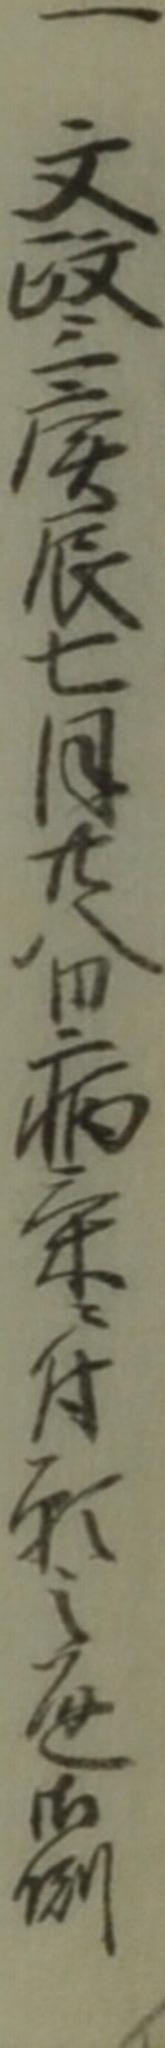一文政三庚七月廿八日病気ニ付願之通御側
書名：諸御役代々録（五）
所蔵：伊那市立高遠町図書館・合同会社AMANE
